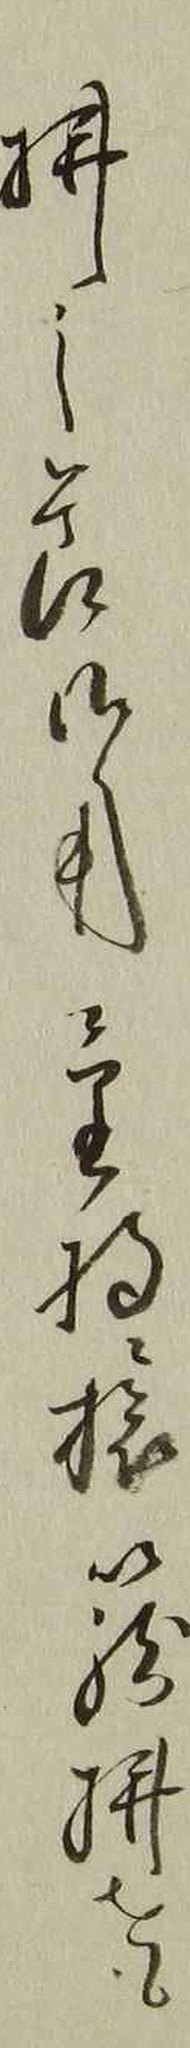払之節御用金持ニ旅籠払をも
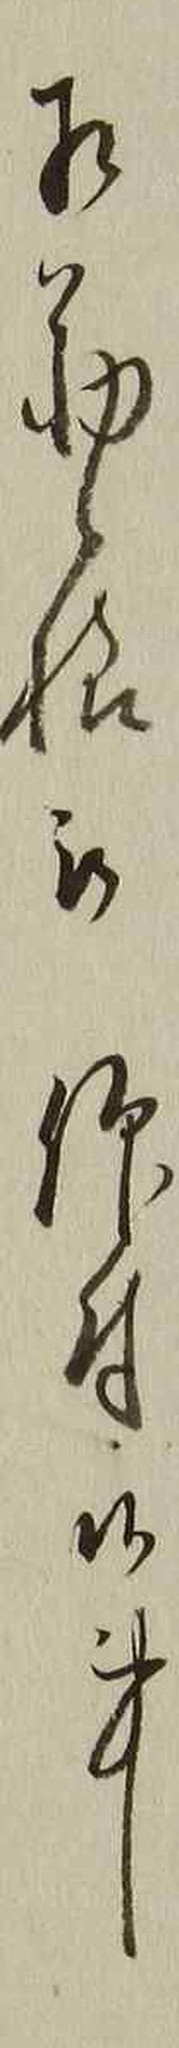相勤候様被仰付候事
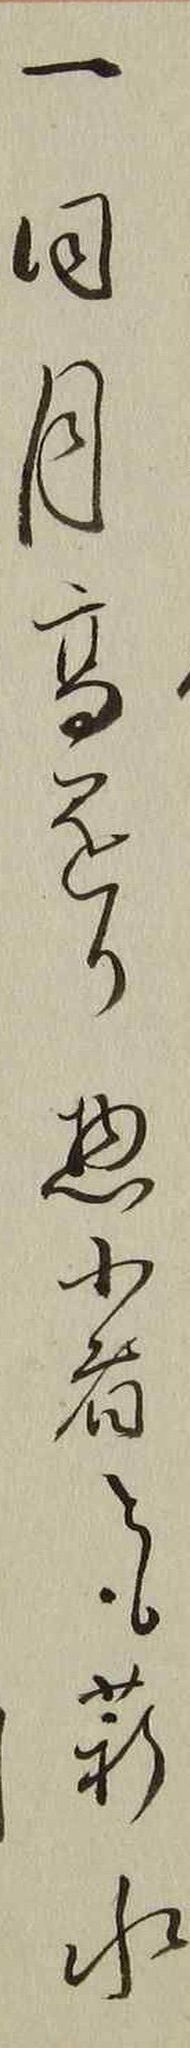一同月高懸り惣小者とも薪水
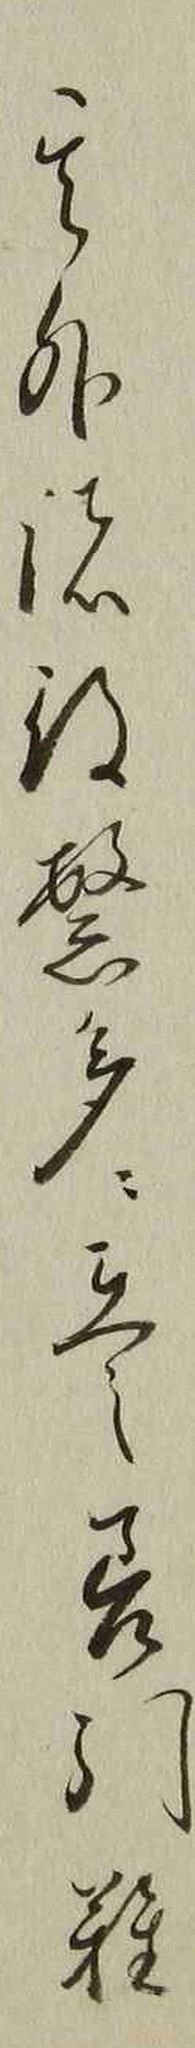其外諸役繁多ニ在之差引難
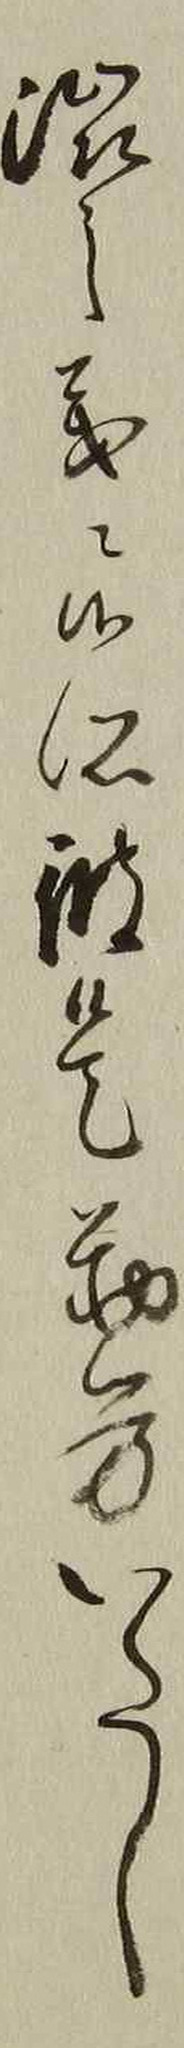渋之義ニ候所彼是勤労いたし
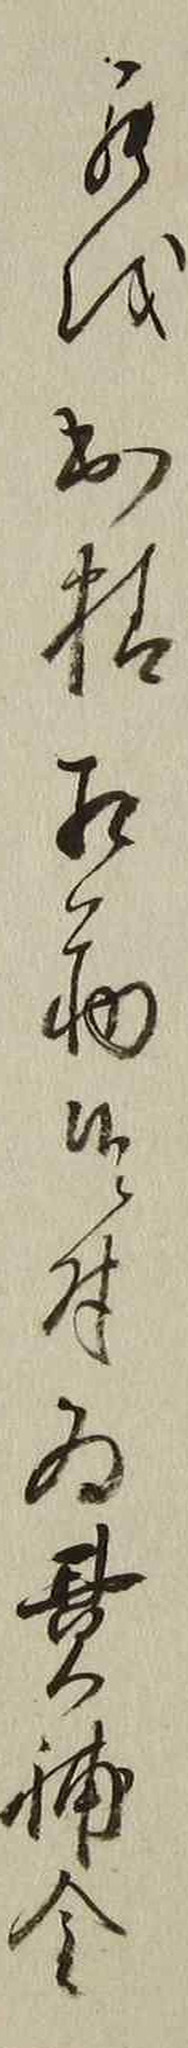罷越出精相勤候ニ付為費補金
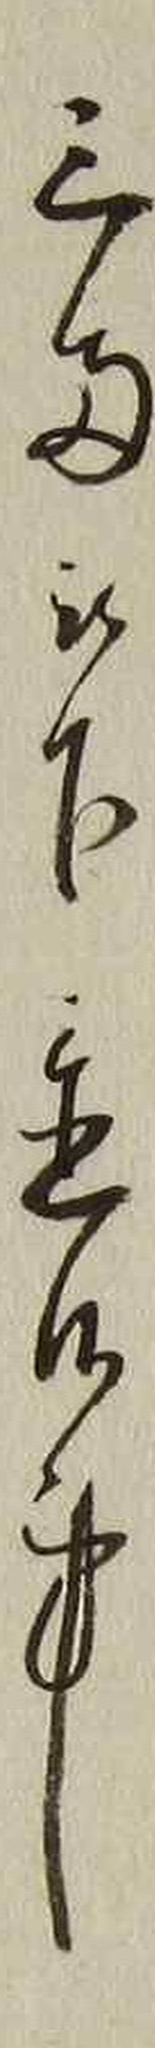三両被下置候事
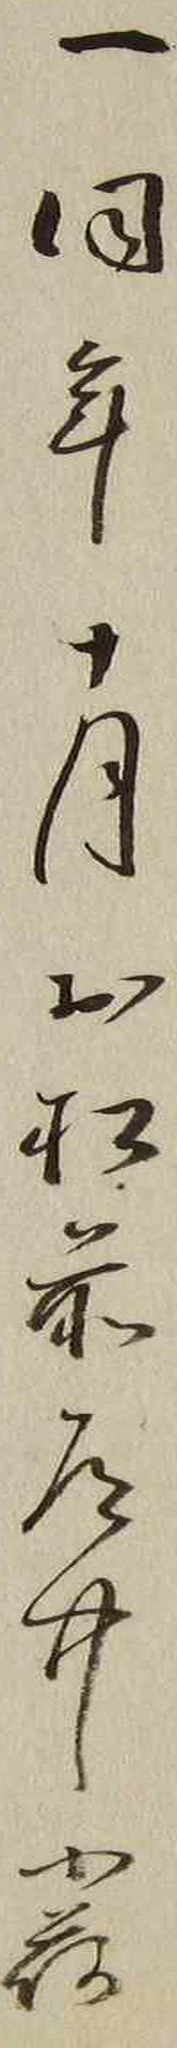一同年十月於松前道中小荷
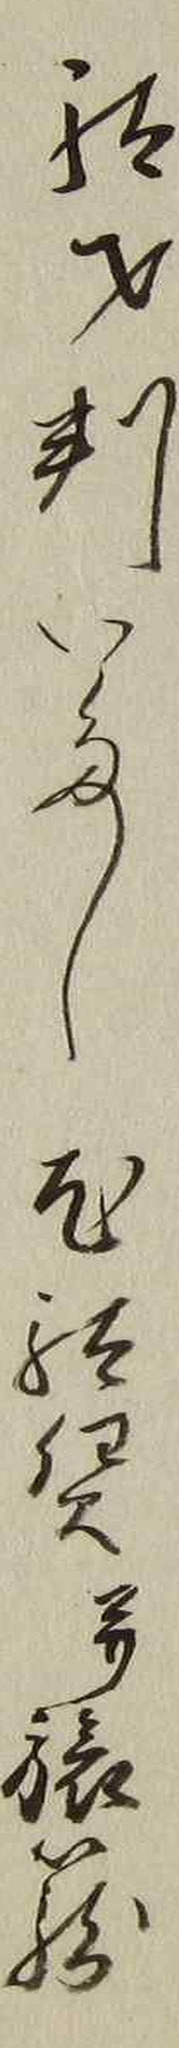駄才判いたし尤駄賃并旅籠
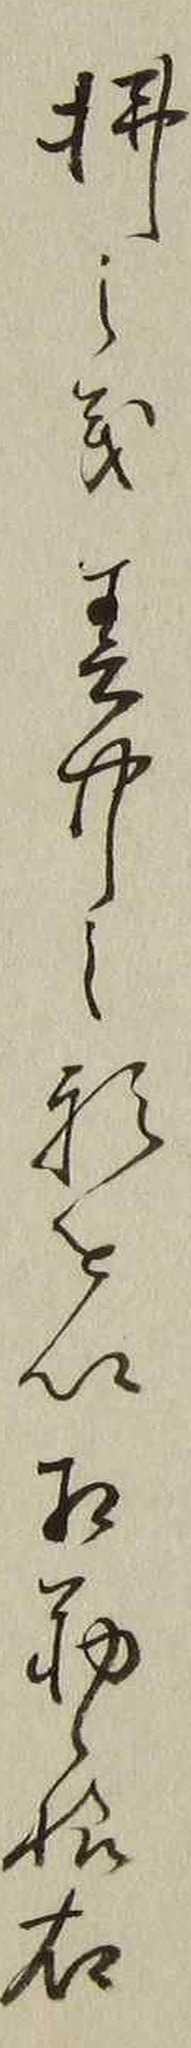払之義春中之形を以相勤候様右
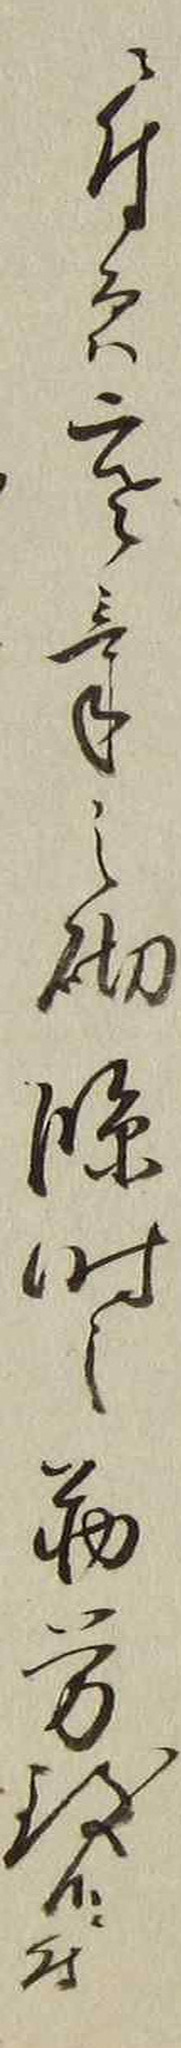ニ付而ハ寒気之砌臨時之勤労致候ニ付
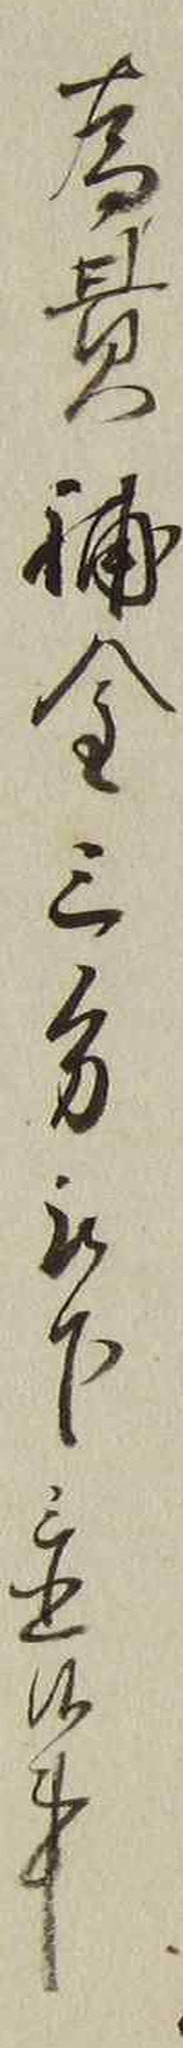為費補金三分被下置候事
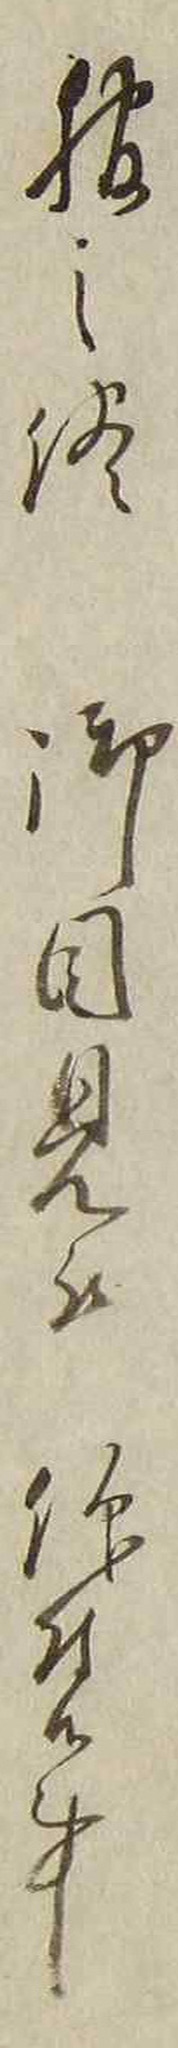服之儘御目見被仰付候事

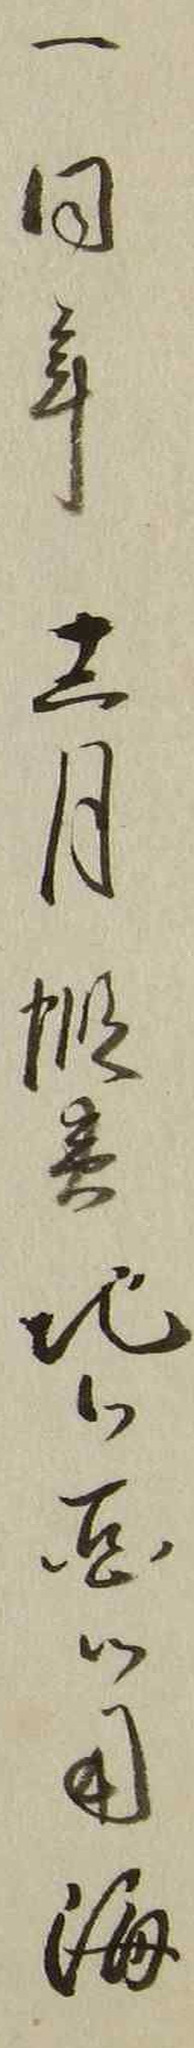一同年十二月蝦夷地御固御用海
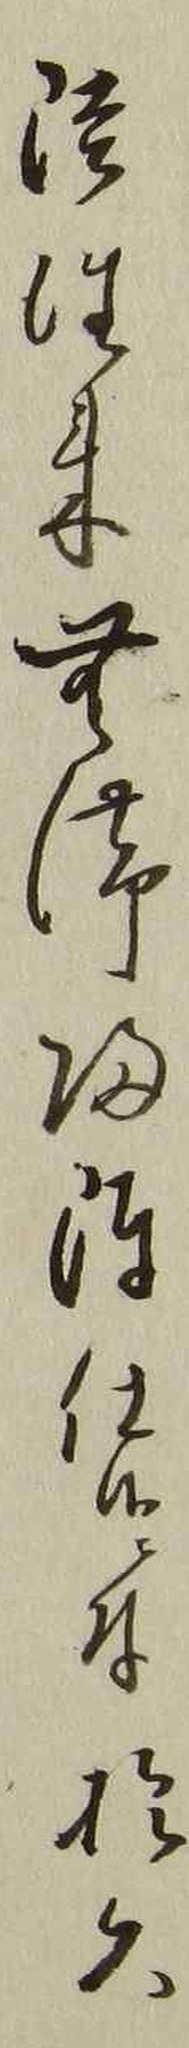陸往来無滞帰陣仕候ニ付於大
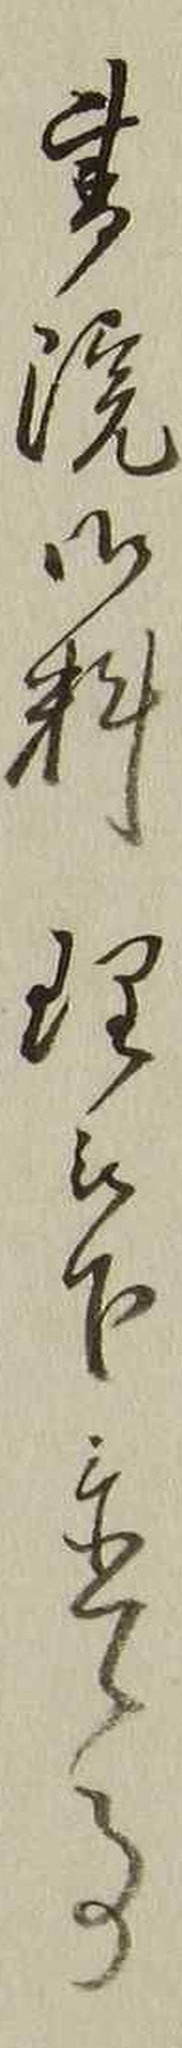書院御料理被下置候事
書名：諸士系譜　巻之132　た之部8
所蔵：会津若松市立会津図書館
